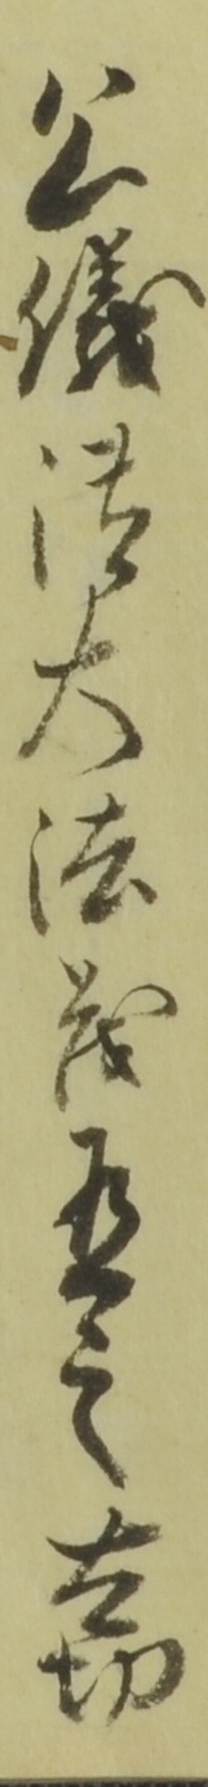公儀御大法も有之太切
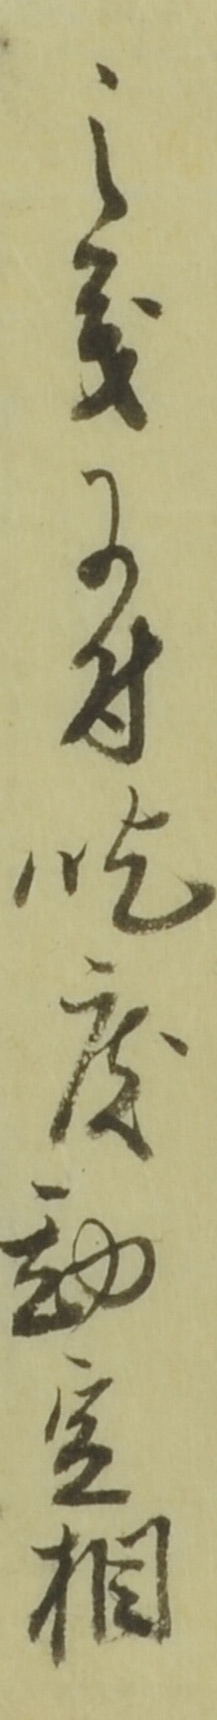之義に付屹度勘定相
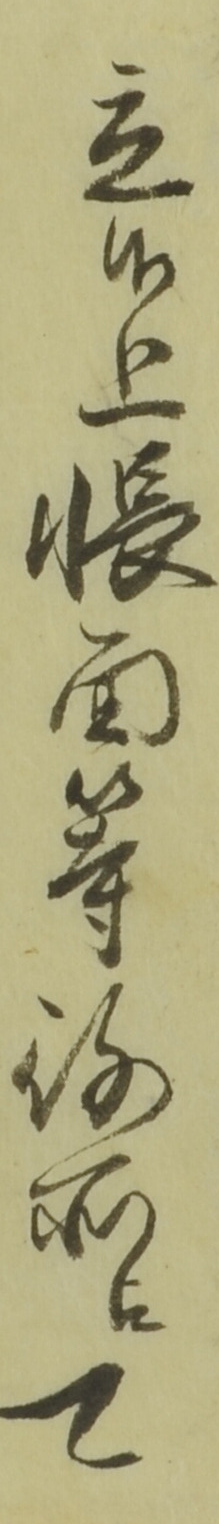立候上帳面等役所江可
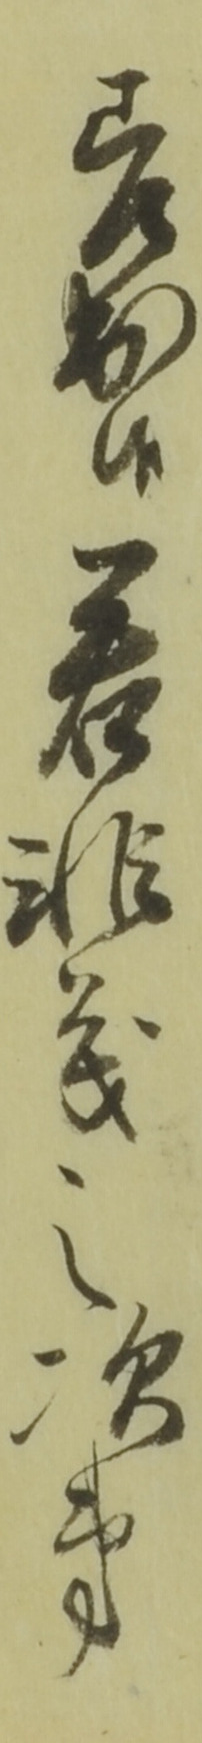差出候若非義之次第
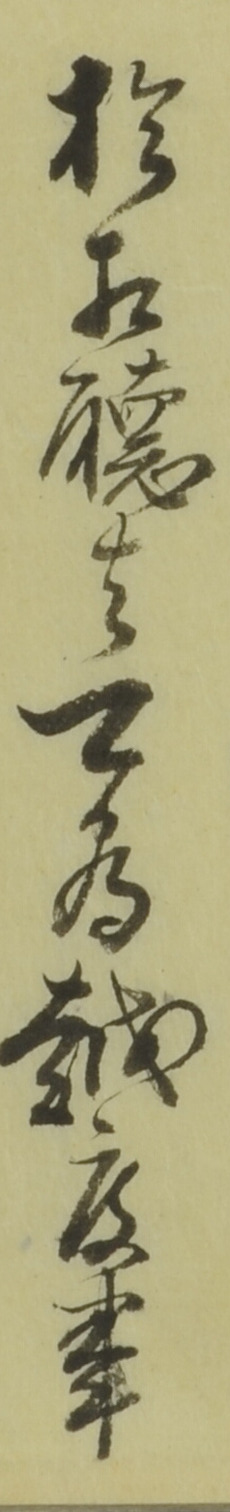於相聴は可為越度事
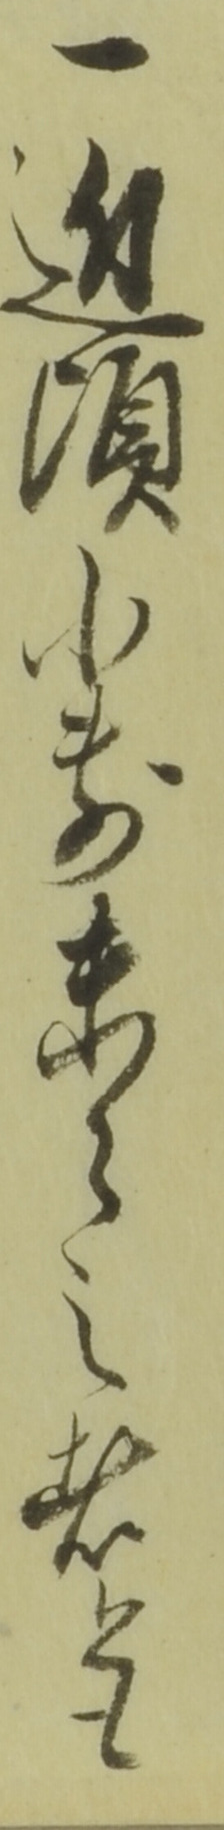一近頃小前末々之者とも
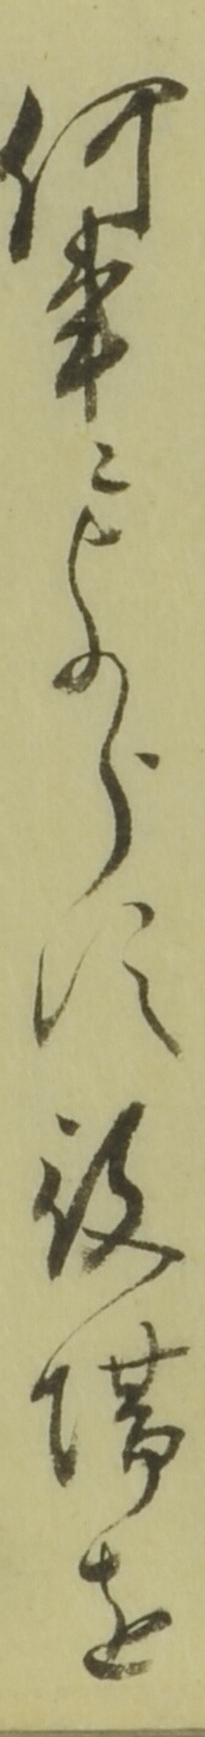何事ニよらす役場を
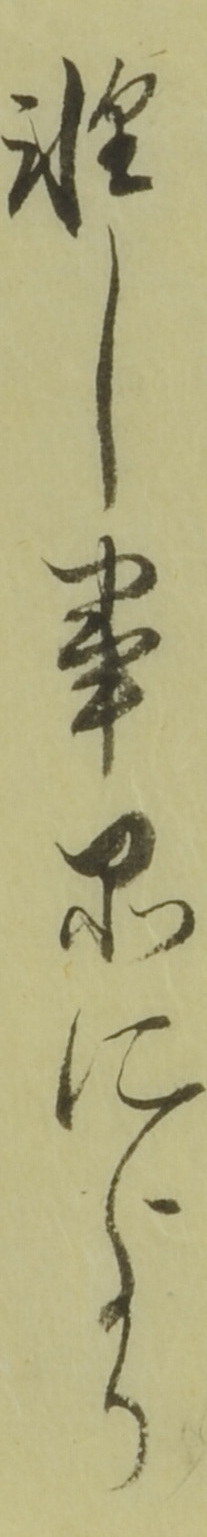軽し事品により
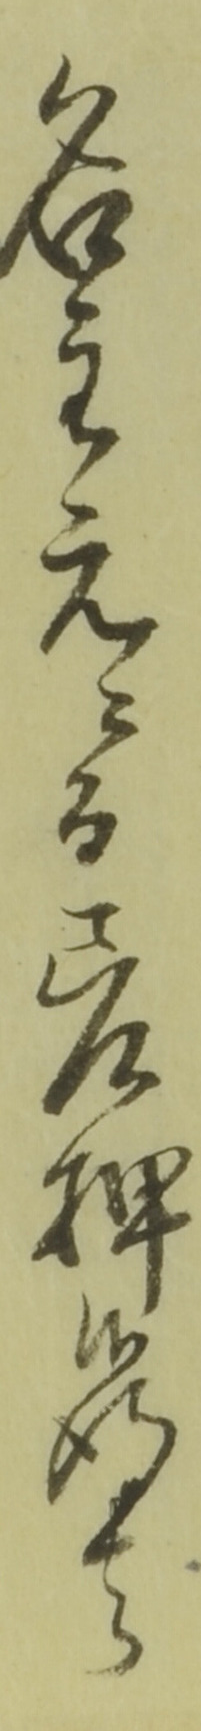名主元ニ而差押候得は

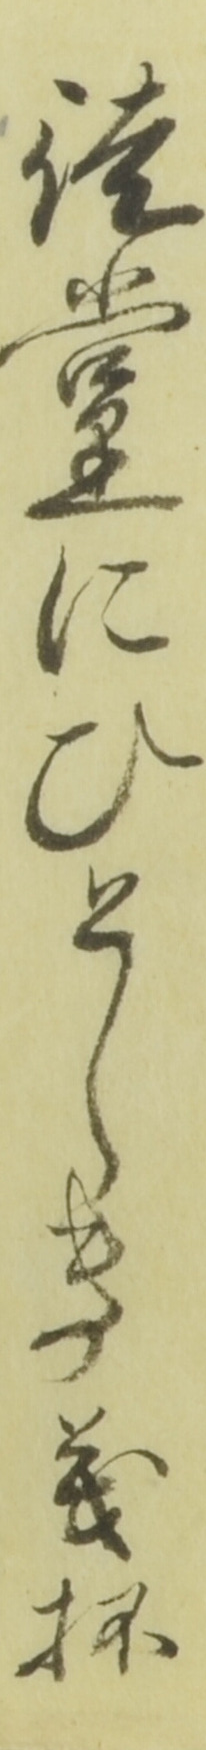徒堂にひとしき義等
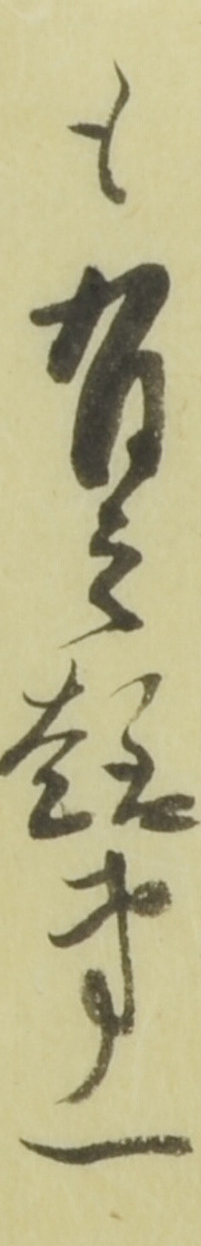も有之趣第一
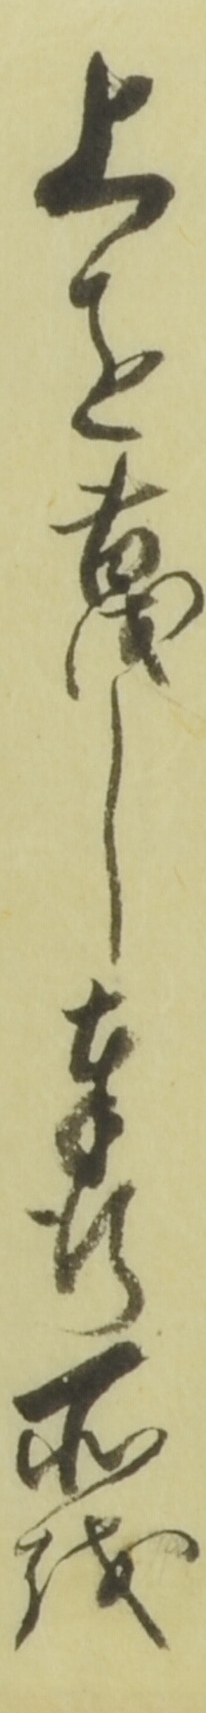上を蔑し奉行所を
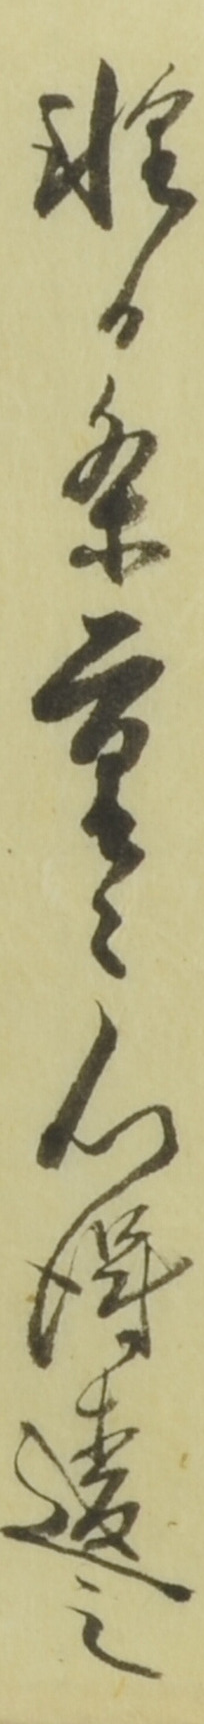軽候条重々心得違之
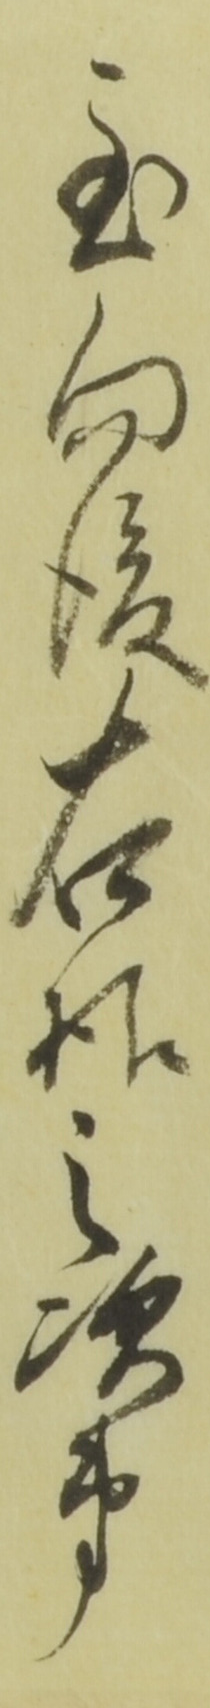至向後右様之次第
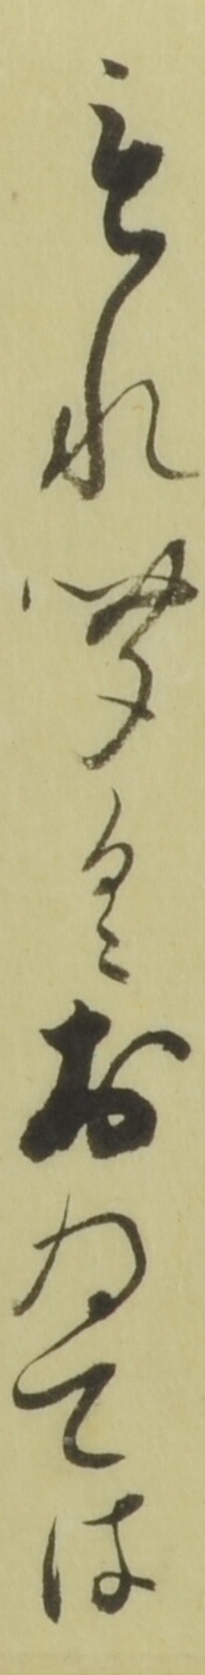もれ聞くおゐては
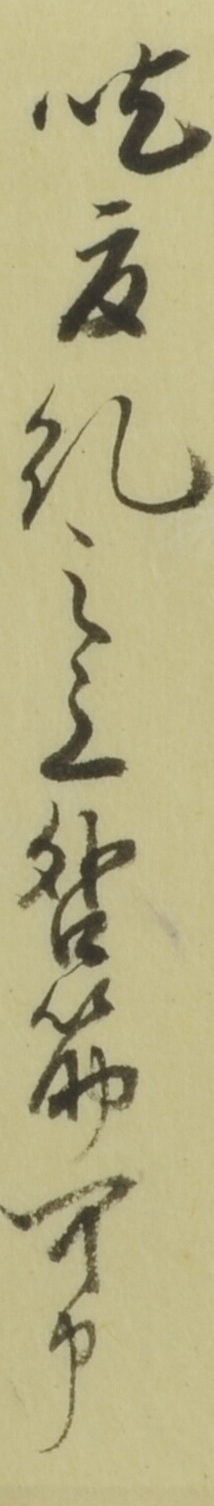屹度糺之上咎筋可申
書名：御触書御書附控
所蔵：伊那市立高遠町図書館・合同会社AMANE
